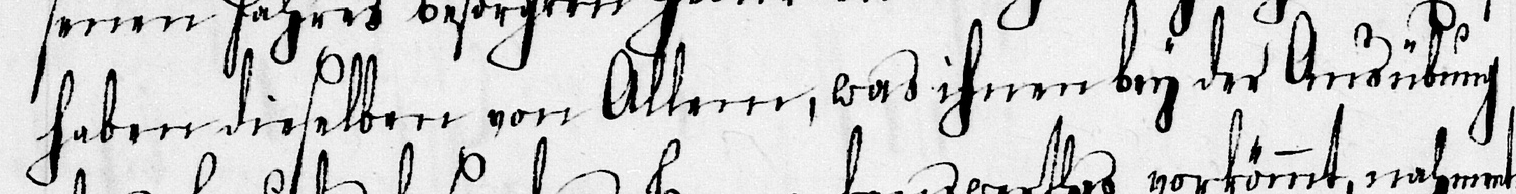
haben dieselben von Allem, was ihnen bey der Ausübung
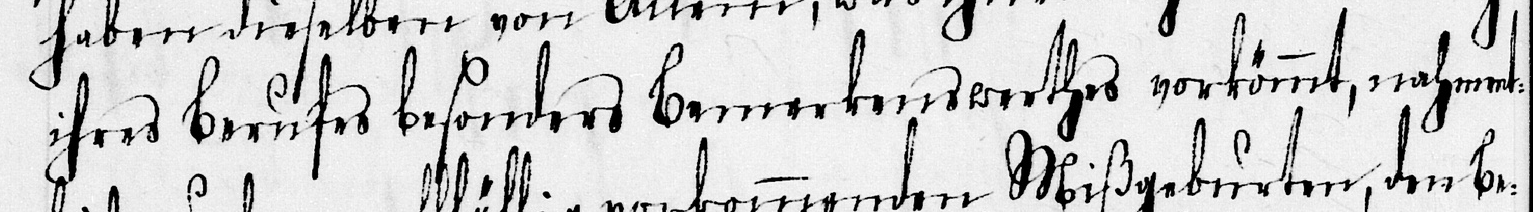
ihres Berufes besonders Bemerkenswerthes vorkömmt, nahmen¬
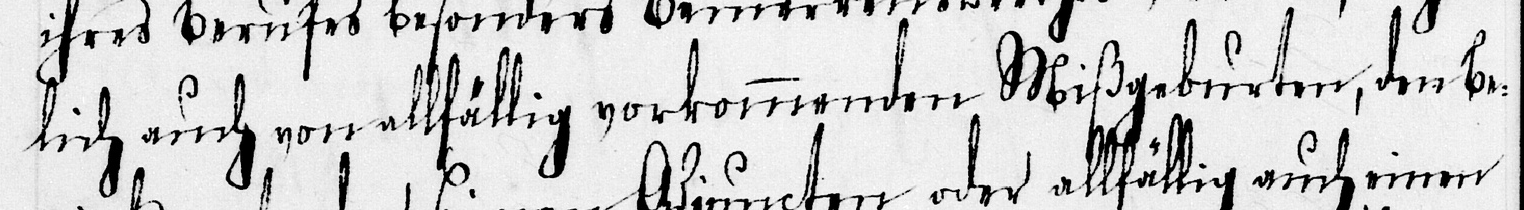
tlich auch von allfällig vorkommenden Mißgeburten, den Be¬
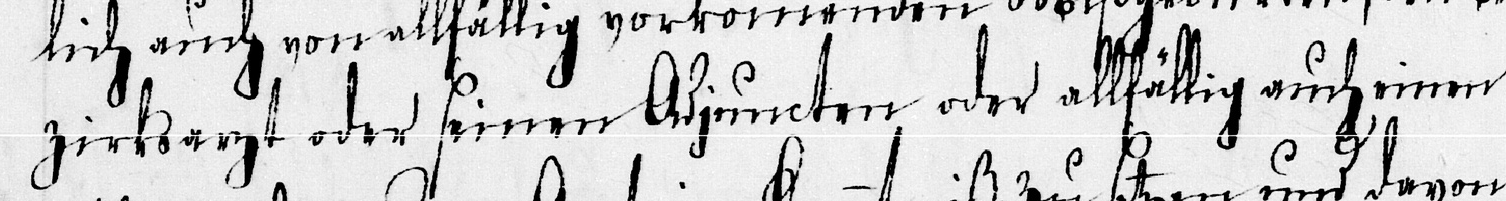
zirksarzt oder seinen Adjuncten oder allfällig auch einen
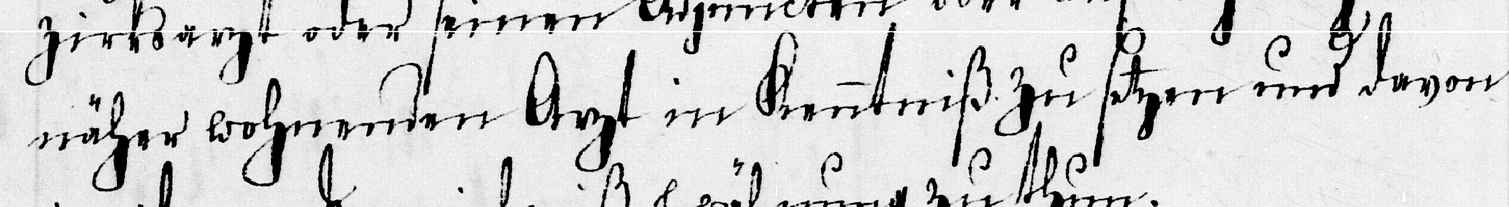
näher wohnenden Arzt in Kenntniß zu setzen und davon
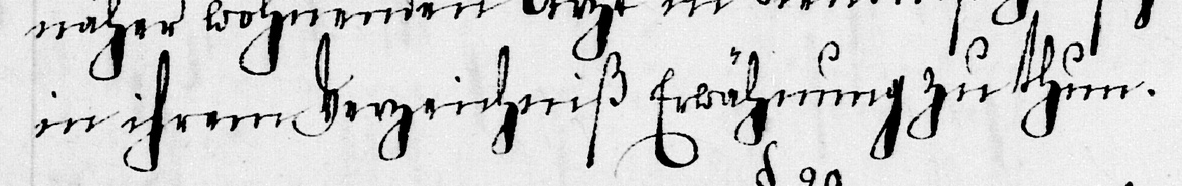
in ihrem Verzeichniß Erwähnung zu thun.
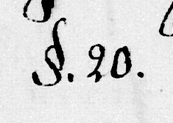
§. 20.
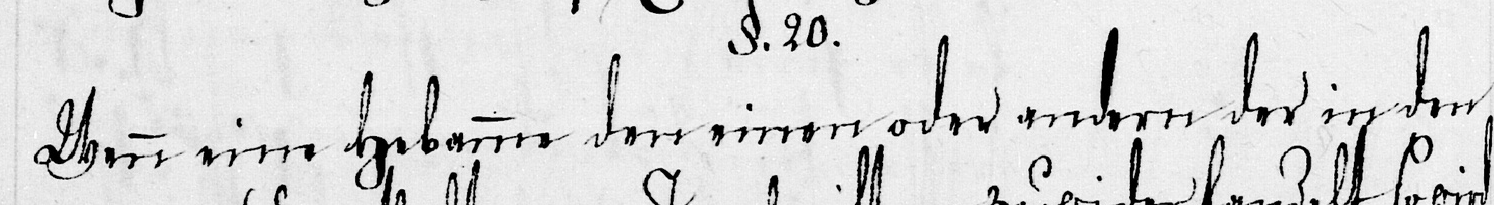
Wenn eine Hebamme den einen oder andern der in den
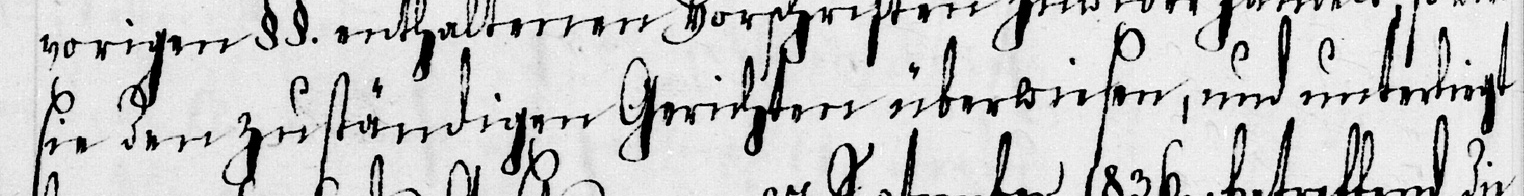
sie den zuständigen Gerichten überwiesen, und unterlie¬
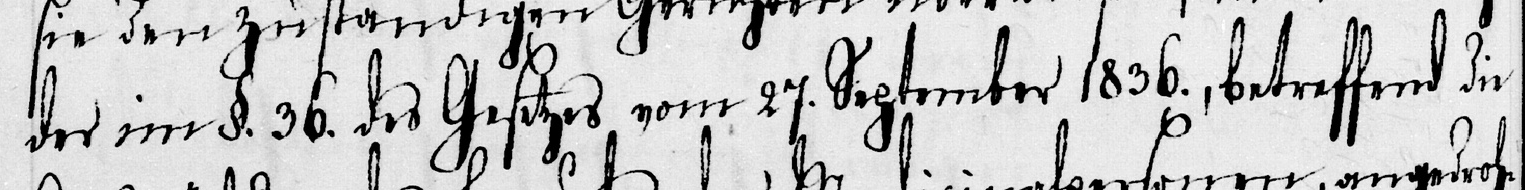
der im §. 36. des Gesetzes vom 27. September 1836., betreffend
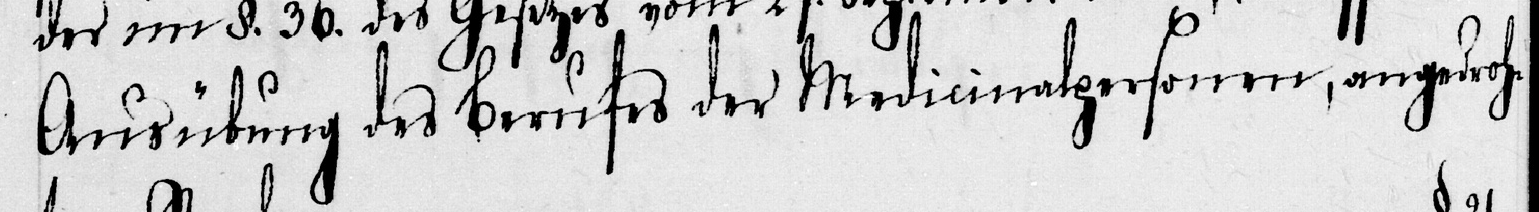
Ausübung des Berufes der Medicinalpersonen, angedroh¬
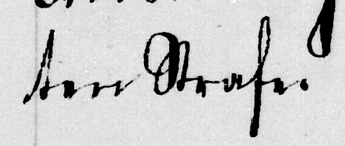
ten Strafen.
